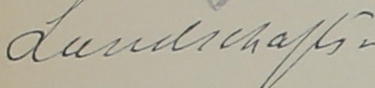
Landschafts
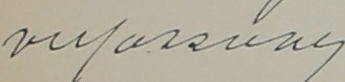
verfassung
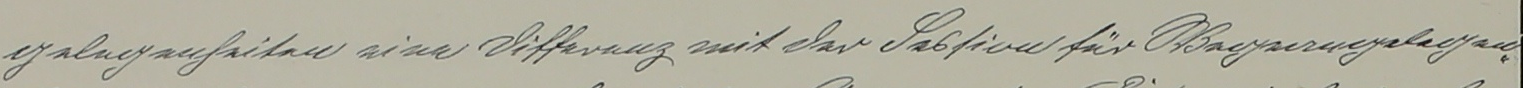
gelegenheiten eine Differenz mit der Session für Wegeangelegen-
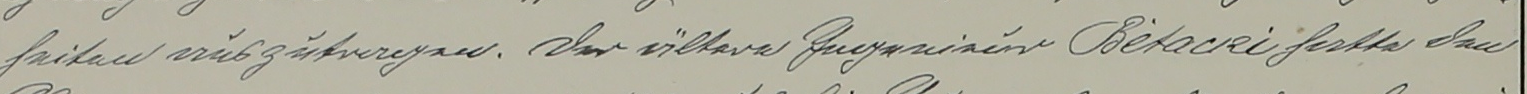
heiten auszutragen. Der ältere Ingenieur Betacki hatte den
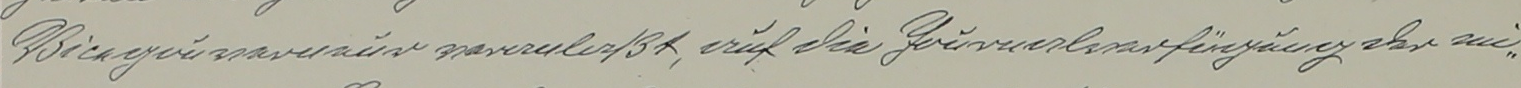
Vicegouverneur veranlaßt, auf die Journalverfügung der mi-
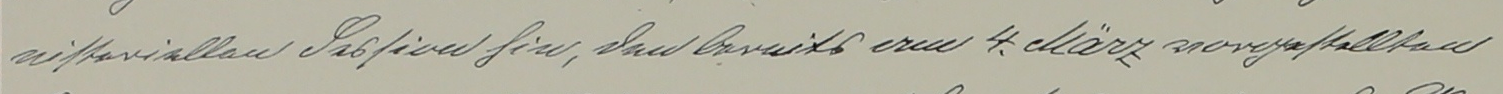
nisteriellen Session hin, den bereits am 4. März vorgestellten
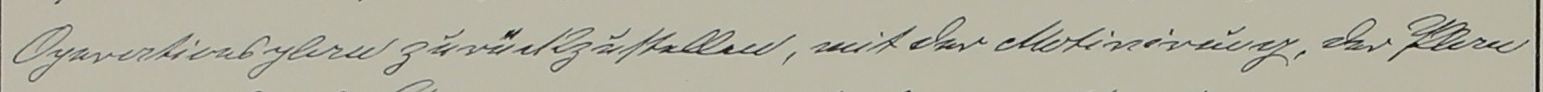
Operationsplan zurückzustellen, mit der Motivirung, der Plan
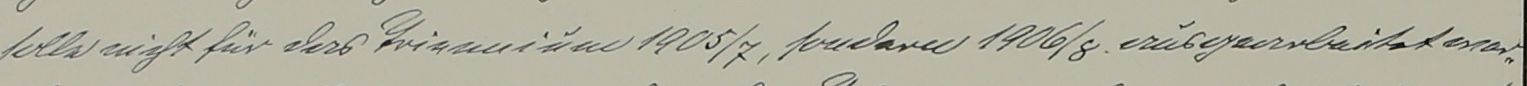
solle nicht für das Triennium 1905/7, sondern 1906/8. ausgearbeitet wer-
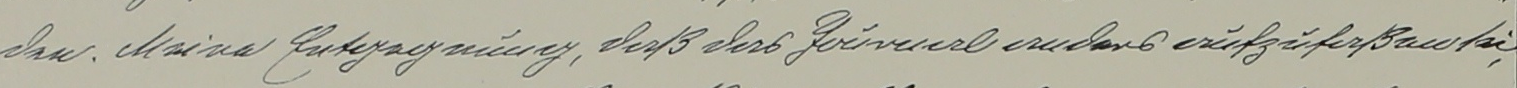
den. Meine Entgegnung, daß das Journal anders aufzufaßen sei,
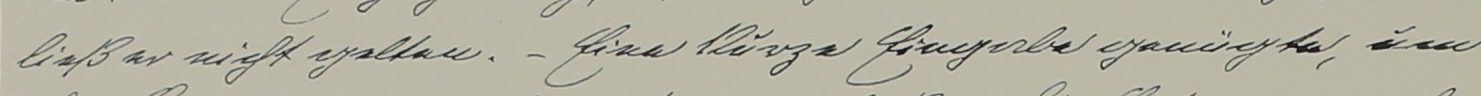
ließ er nicht gelten. – Eine kurze Eingabe genügte, um
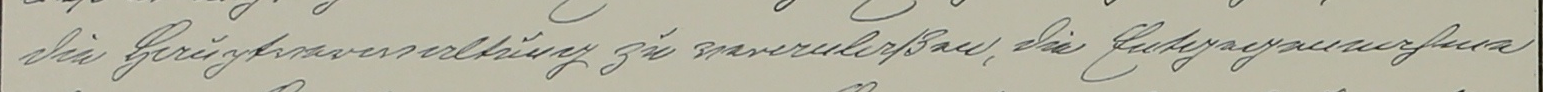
die Hauptverwaltung zu veranlaßen, die Entgegennahme
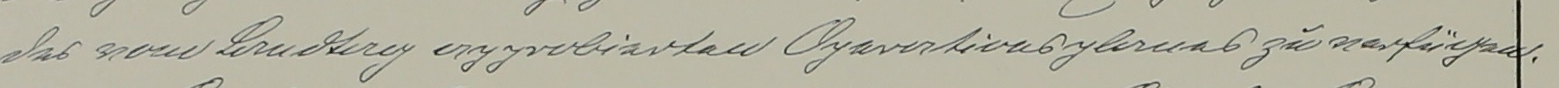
des vom Landtag approbierten Operationsplanes zu verfügen.
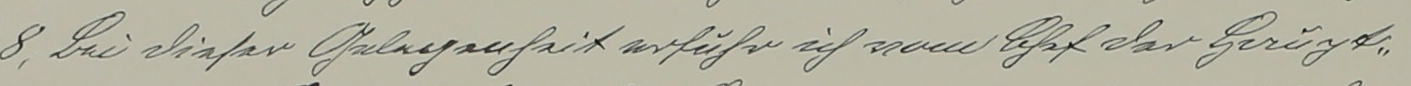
8. Bei dieser Gelegenheit erfuhr ich vom Chef der Haupt-
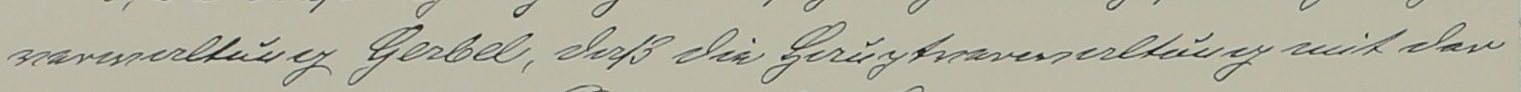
verwaltung Gerbel, daß die Hauptverwaltung mit der
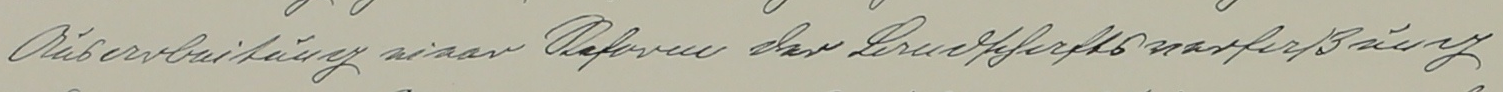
Ausarbeitung einer Reform der Landschaftsverfaßung
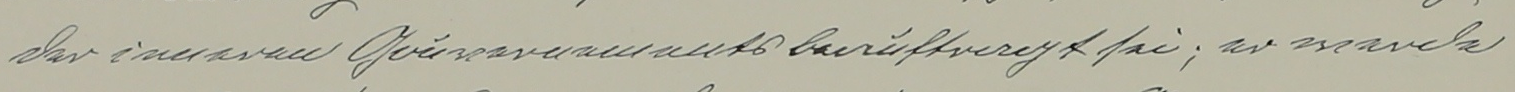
der inneren Gouvernements beauftragt sei; er werde
